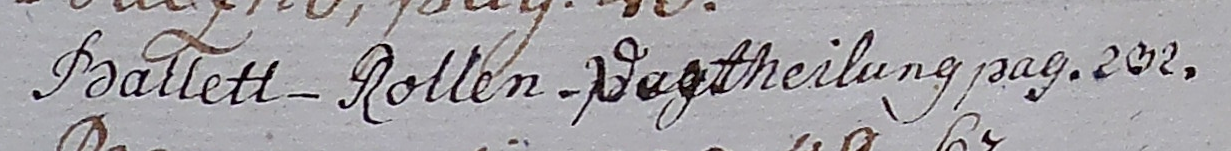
Ballett_Rollen_Vertheilung pag. 232.
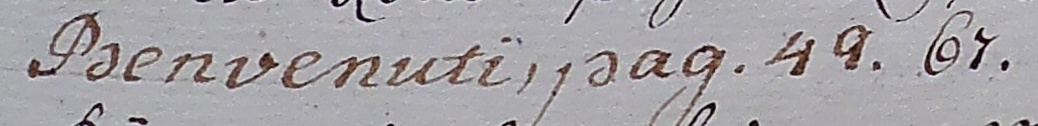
Benvenuti, pag. 49. 67.
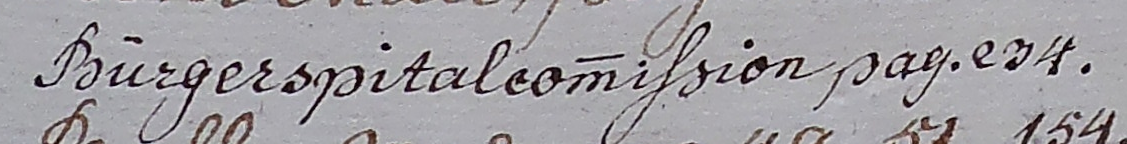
Bürgerspitalcom̅ission pag. 234.
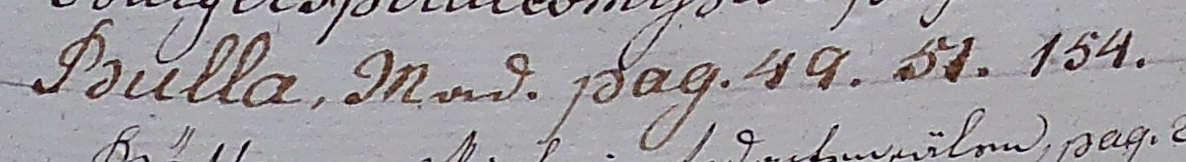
Bulla, Mad. pag. 49. 51. 154.
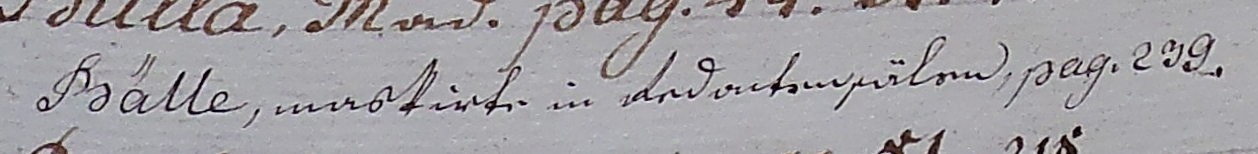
Bälle, maskirte in Redoutensälen, pag. 239.
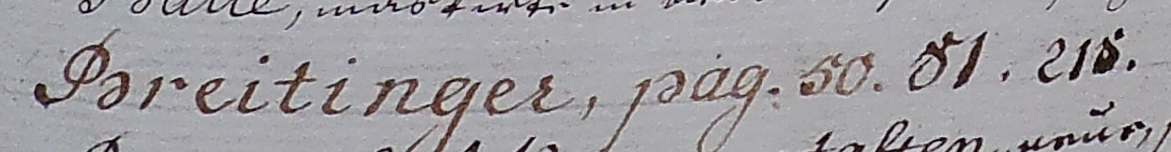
Breitinger, pag. 50. 81. 218.
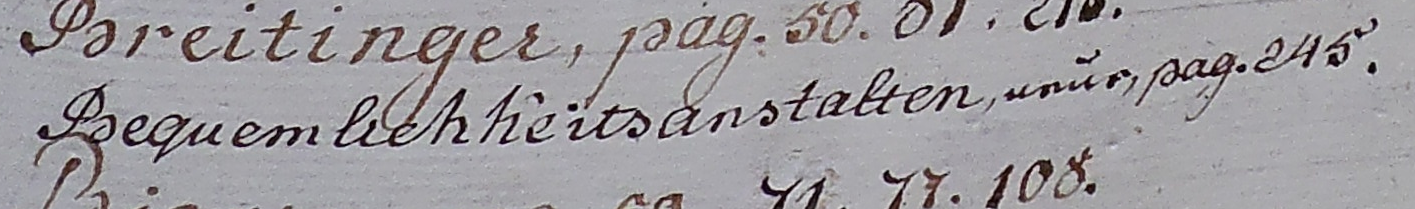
Bequemlichkeitsanstalten, neue, pag. 245.
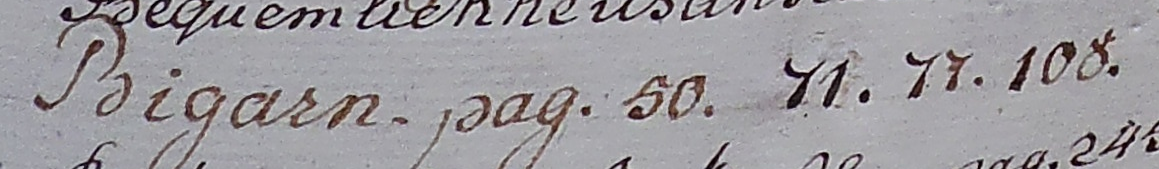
Bigarn. pag. 50. 71. 77. 108.
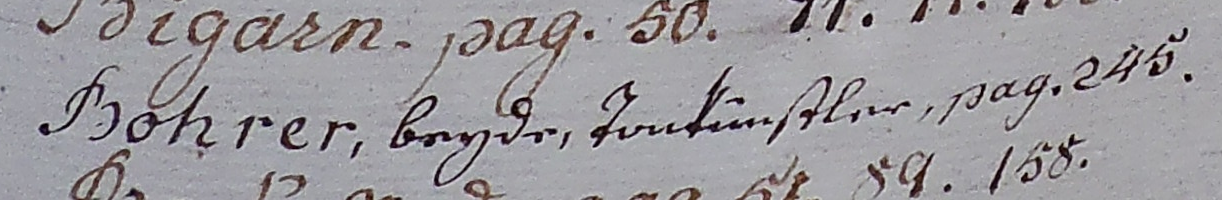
Bohrer, beyde, Tonkünstler, pag. 245.
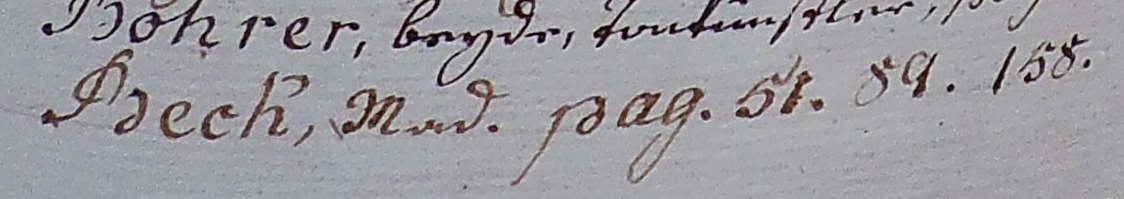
Beck, Mad. pag. 51. 89. 158.
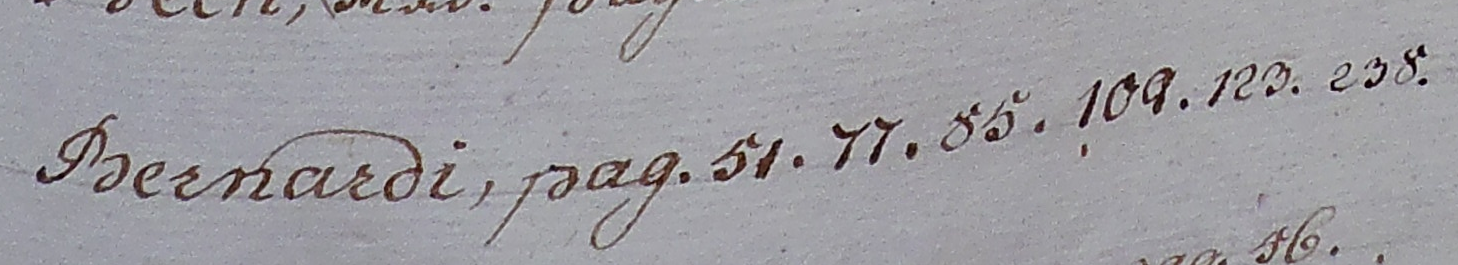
Bernardi, pag. 51. 77. 85. 109. 123. 238.
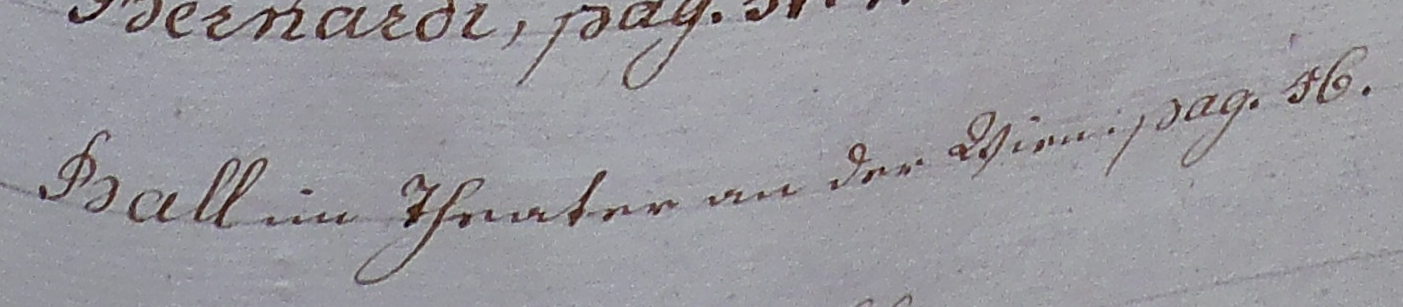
Ball im Theater an der Wien. pag. 56.
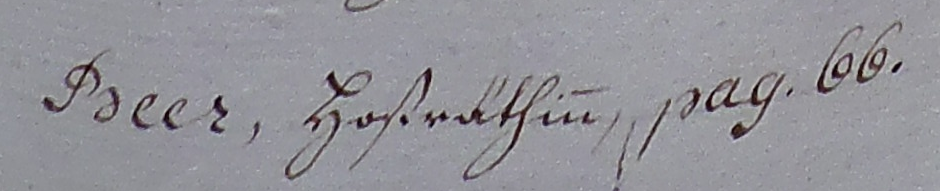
Beer, Hofräthin̅, pag. 66.
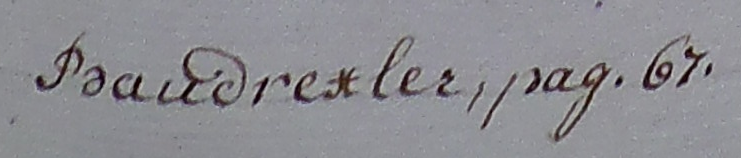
Baudrexler, pag. 67.
